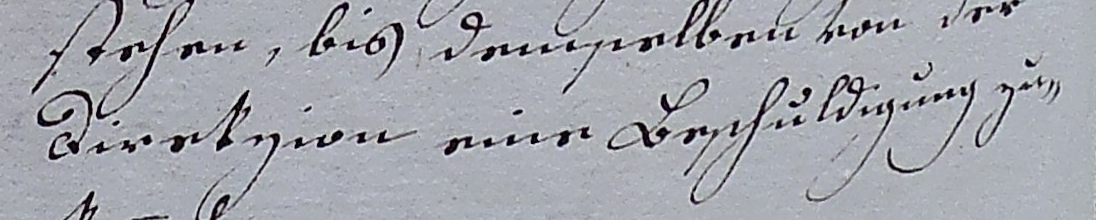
Direkzion eine Beschuldigung zu¬
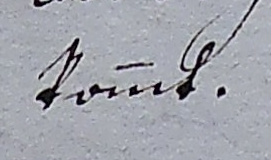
kom̅t.
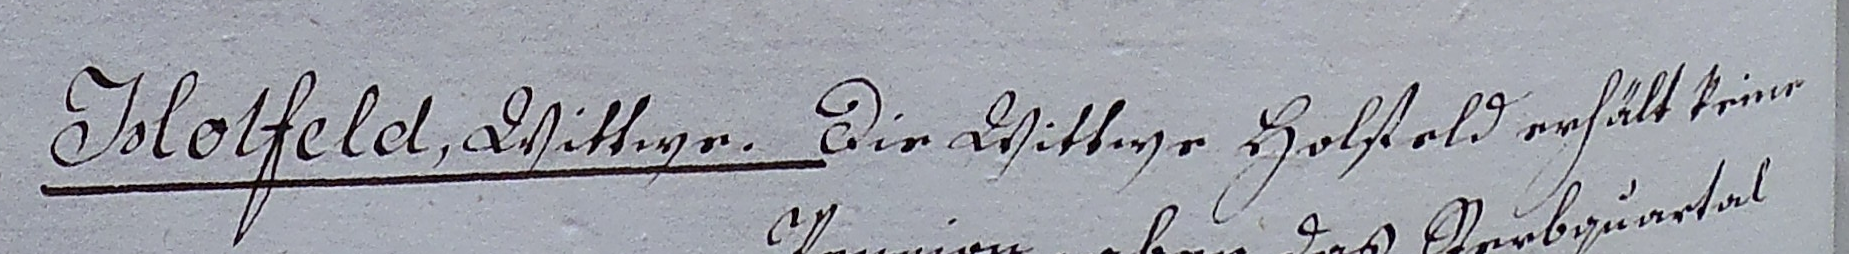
Holfeld, Wittwe. Die Wittwe Holfeld erhält keine
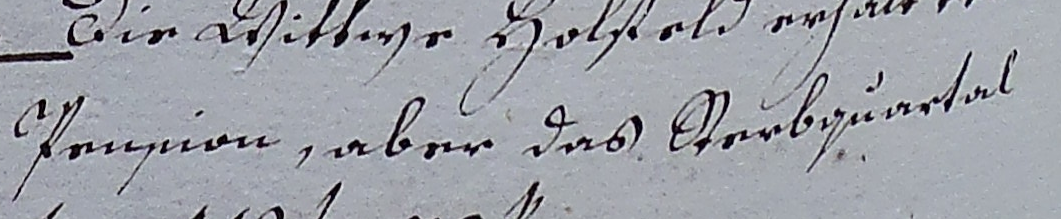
Pension, aber das Sterbquartal
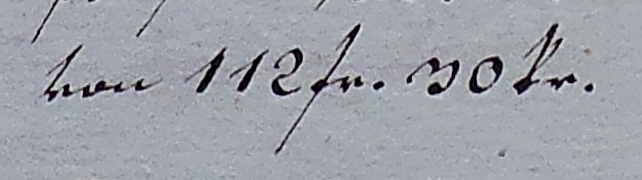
von 112fr. 30 kr.
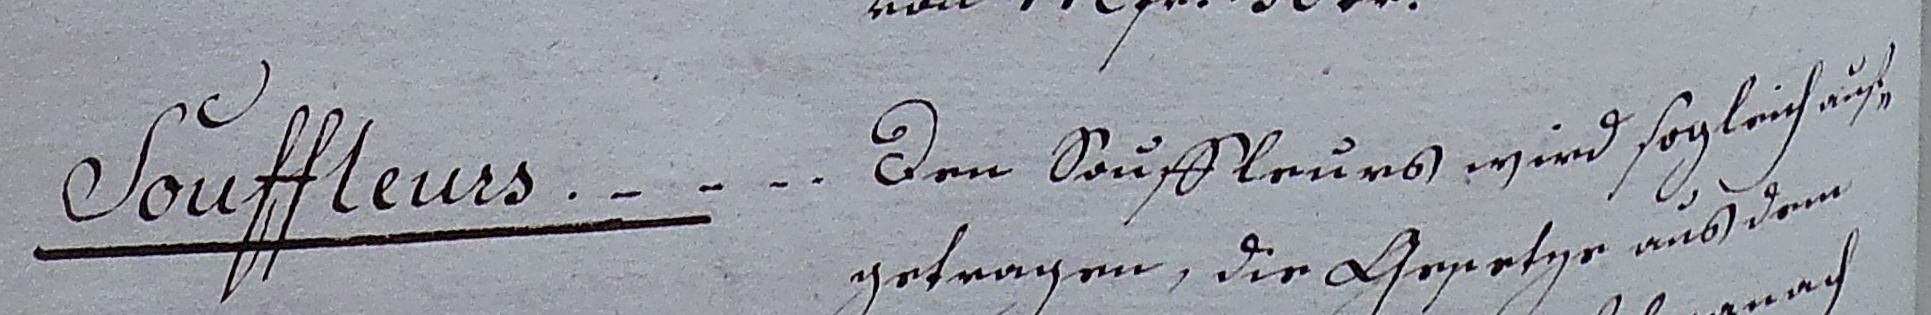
Souffleurs. .. .. .. Den Souffleurs wird sogleich auf¬
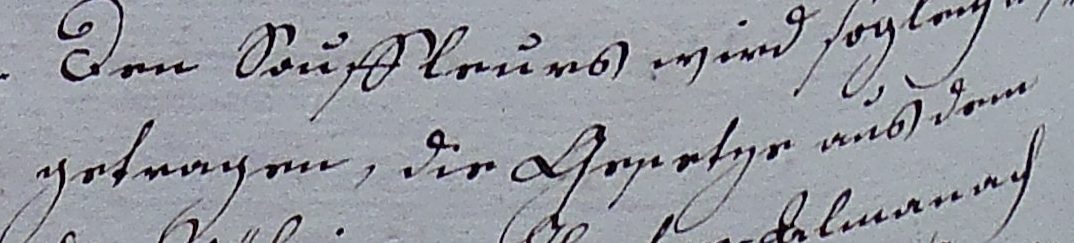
getragen, die Gesetze aus dem
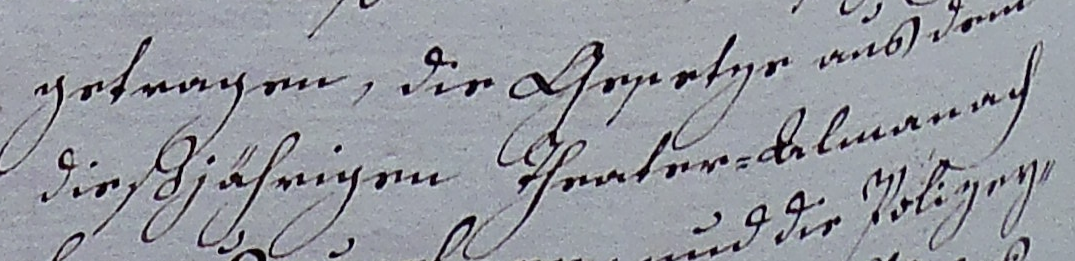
dießjährigen Theater=Almanach
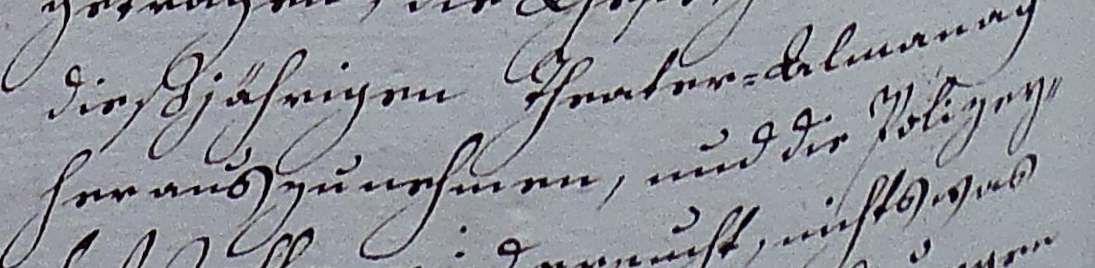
herauszunehmen, und die Polizey¬
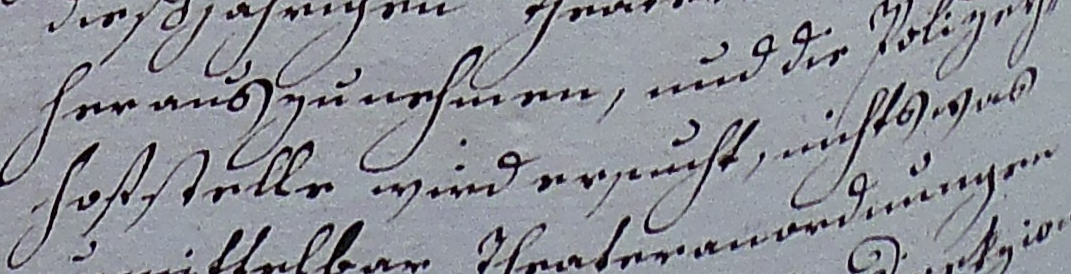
hofstelle wird ersucht, nichts was
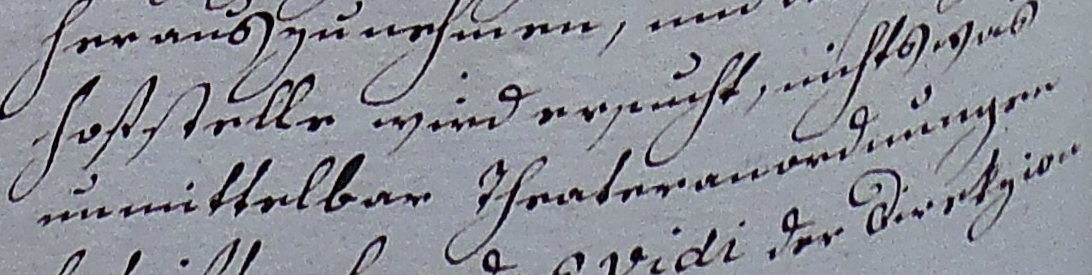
unmittelbar Theateranordnungen
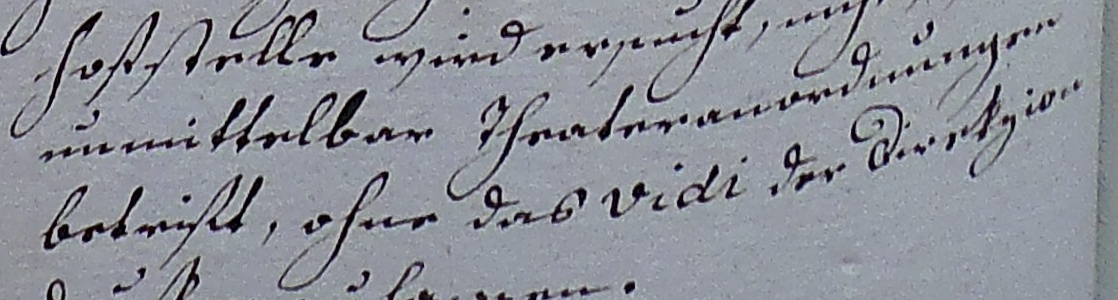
betrift, ohne das vidi der Direkzion
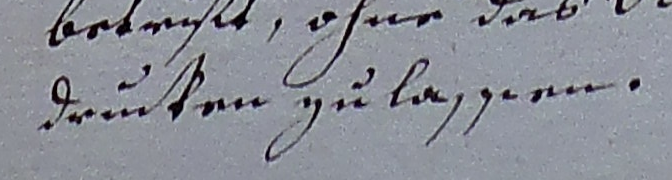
drucken zu lassen.
